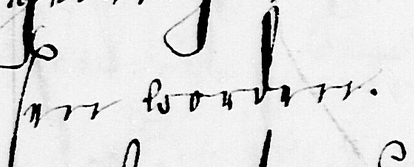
sen worden.
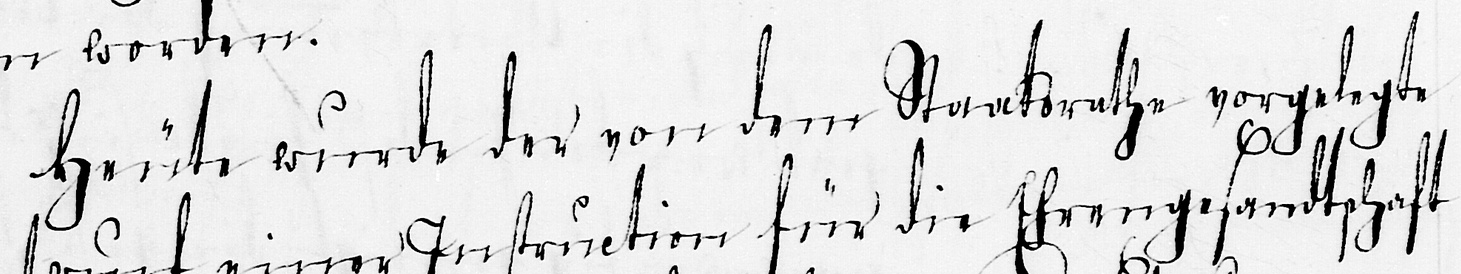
Heute wurde der von dem Staatsrathe vorgelegte
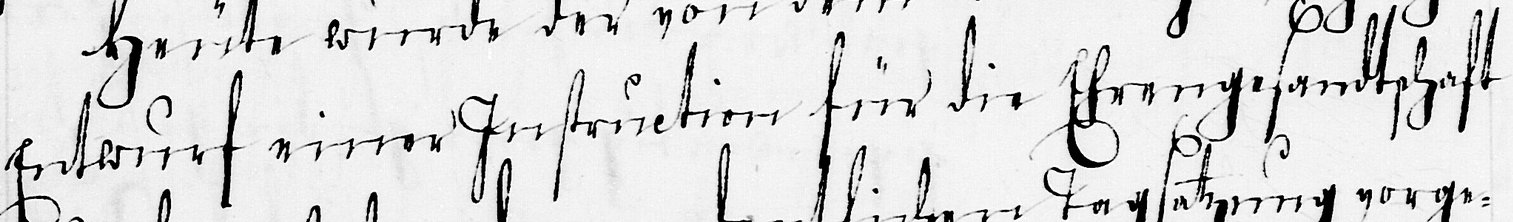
Entwurf einer Instruction für die Ehrengesandtschaft
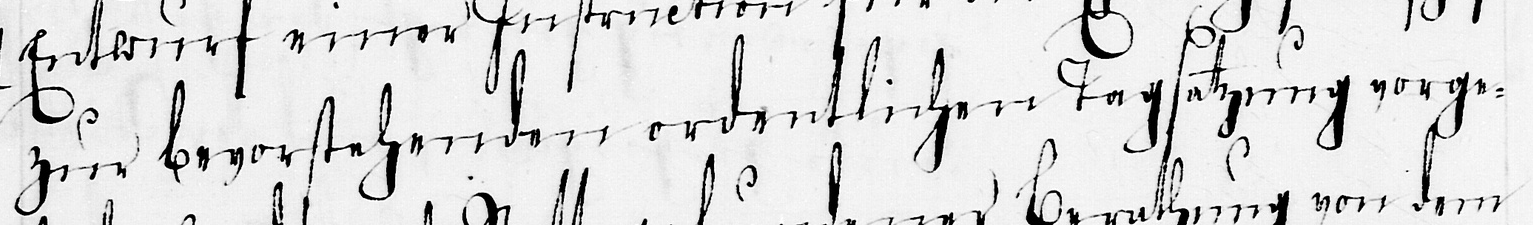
zur bevorstehenden ordentlichen Tagsatzung vorge¬
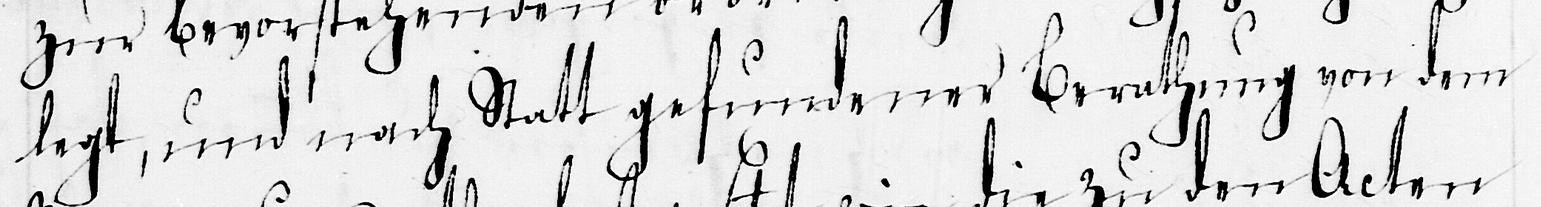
legt, und nach Statt gefundener Berathung von dem
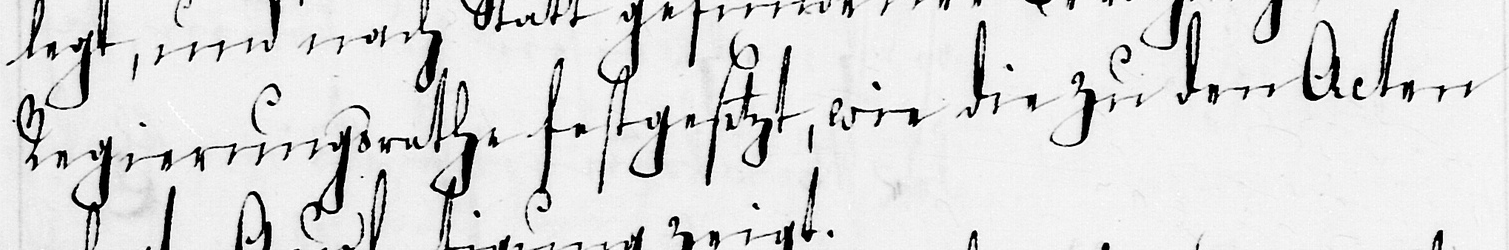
Regierungsrathe festgesetzt, wie die zu den Acten
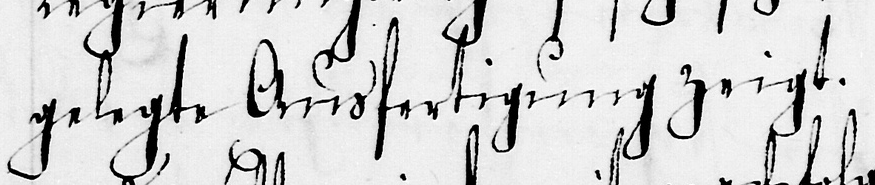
gelegte Ausfertigung zeigt.
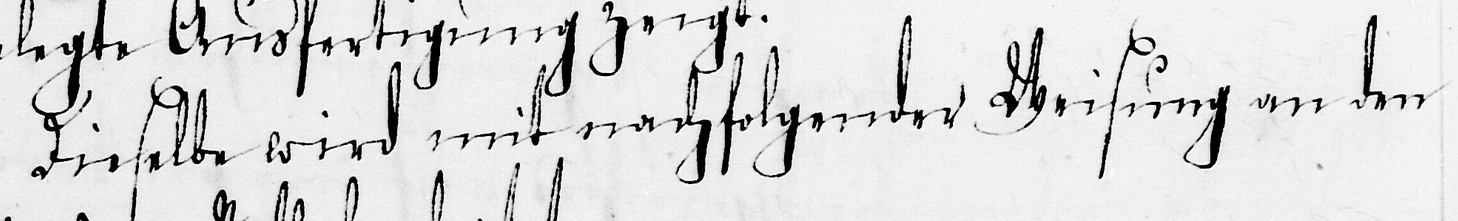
Dieselbe wird mit nachfolgender Weisung an den
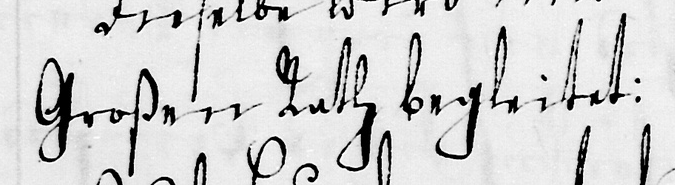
Großen Rath begleitet:
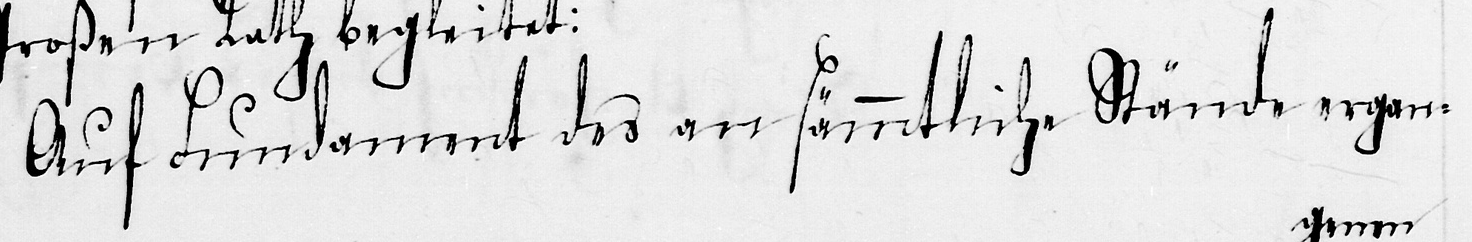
Auf Fundament des an sämmtliche Stände ergan-
